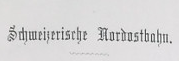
Schweizerische Nordostbahn.
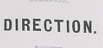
ad No. 1811.
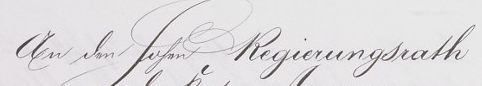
An den Hohen Regierungsrath
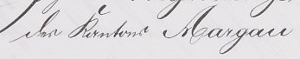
des Kantons Aargau
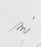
in
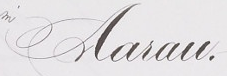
Aarau.
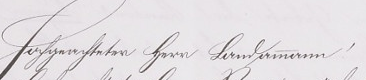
Hochgeachteter Herr Landammann!
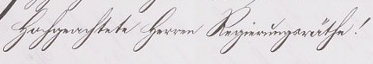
Hochgeachtete Herren Regierungsräthe!
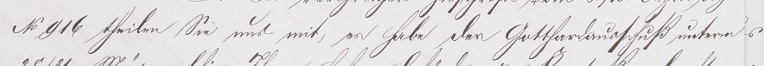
No 916 theilen Sie uns mit, es habe der Gotthardausschuß unterm
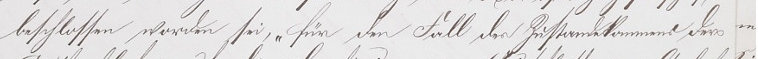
beschlossen worden sei, «für den Fall des Zustandekommens der
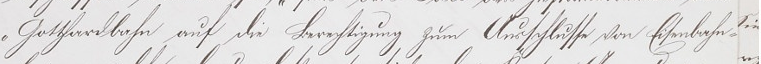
Gotthardbahn auf die Berechtigung zum Ausschlusse von Eisenbahn-
